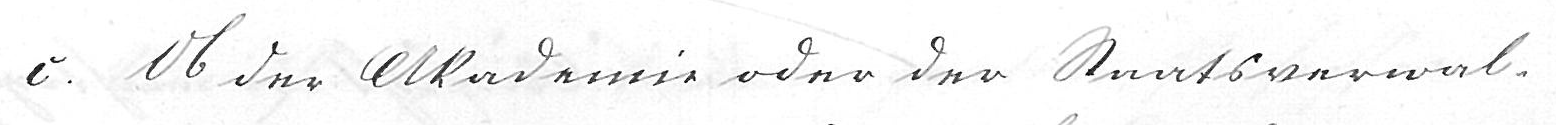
c. Ob der Akademie oder der Staatsverwal-
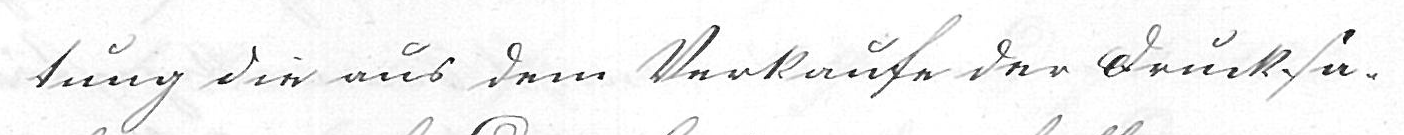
tund die aus dem Verkaufe der Drucksa-
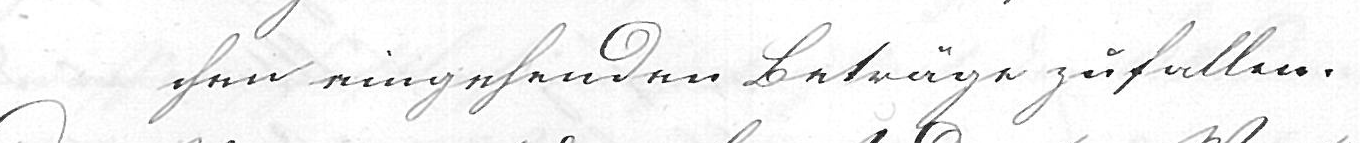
chen eingehenden Beträge zufallen.
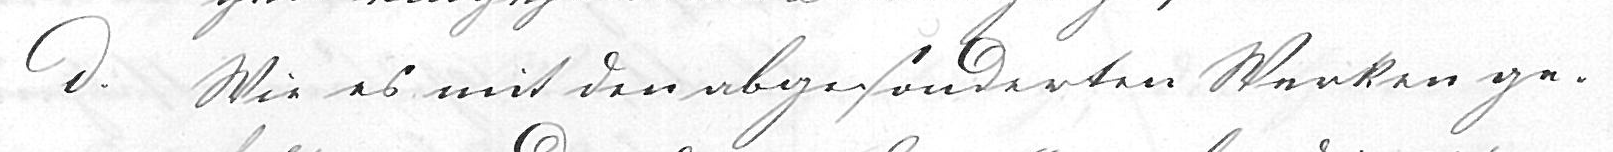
d. Wie es mit den abgesonderten Werken ge-
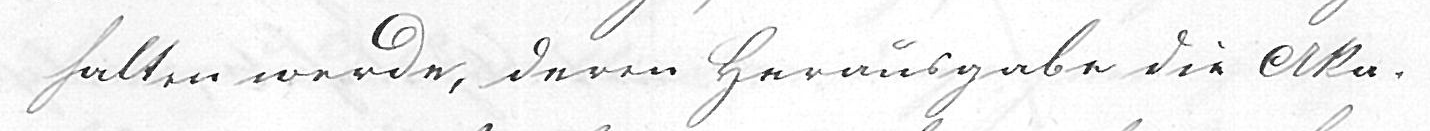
halten werde, deren Herausgabe die Aka-
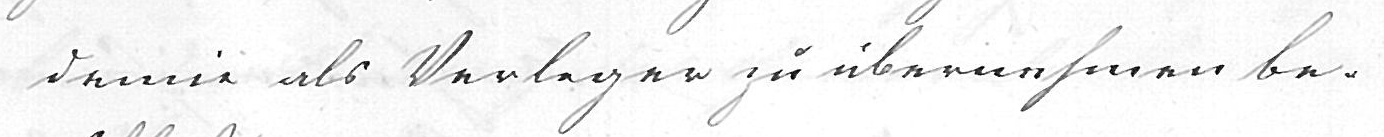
demie als Verleger zu übernehmen be-
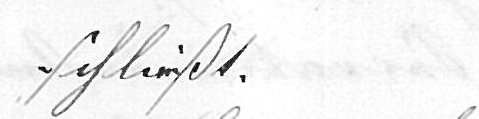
schließt.
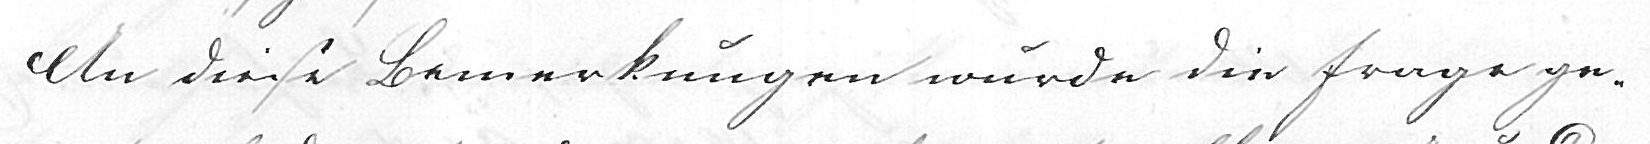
An diese Bemerkungen wurde die Frage ge-
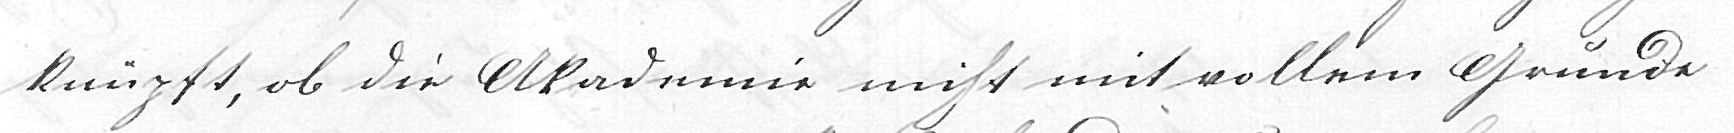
knüpft, ob die Akademie nicht mit vollem Grunde
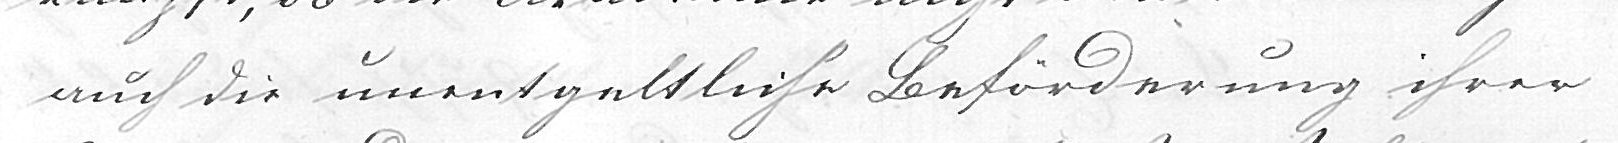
auch die unentgeltliche Beförderung ihrer
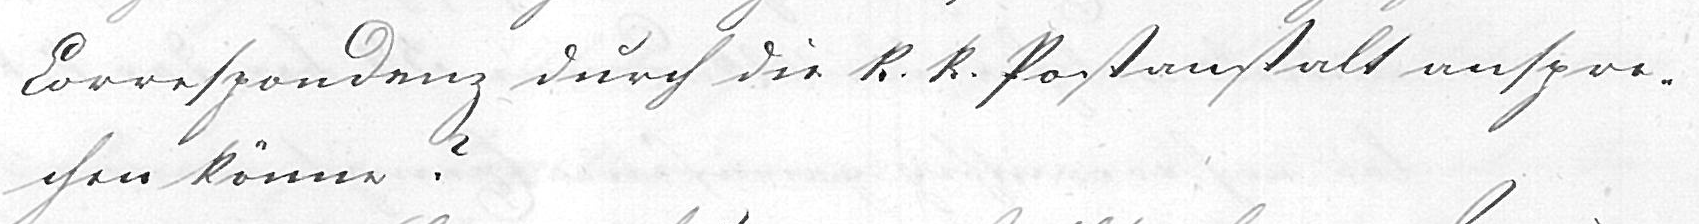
Correspondenz durch die k.k. Postanstalt anspre-
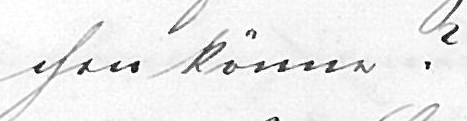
chen könne?
